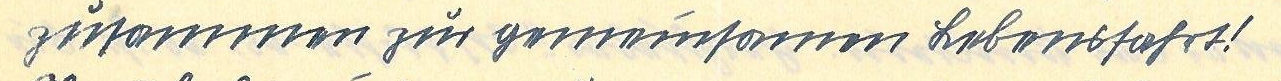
zusammen zur gemeinsamen Lebensfahrt!
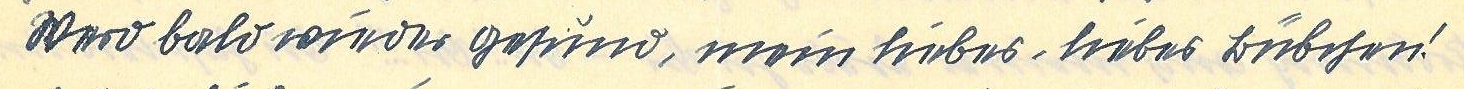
Werd bald wieder gesund, mein liebes, liebes Bübchen!
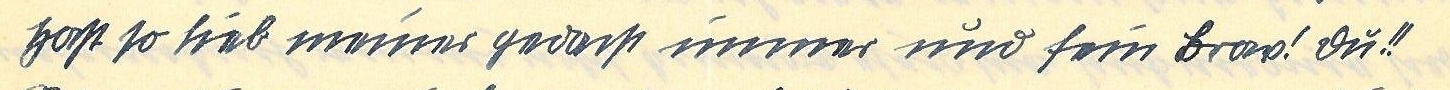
Hast so lieb meiner gedacht immer und fein Brav! Du!!
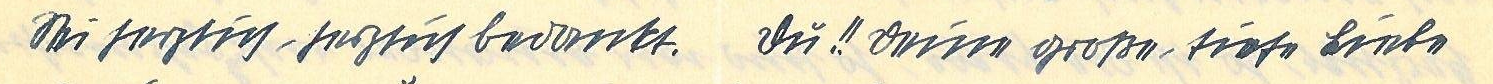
Sei herzlich, herzlich bedankt. Du!! Deine große, tiefe Liebe
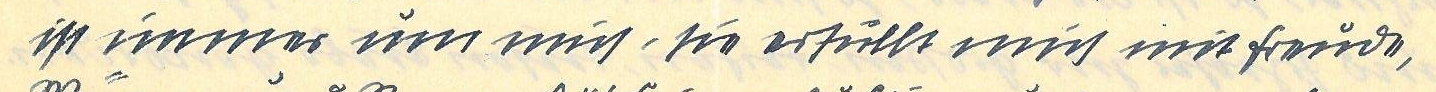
ist immer um mich, sie erfüllt mich mit Freude,
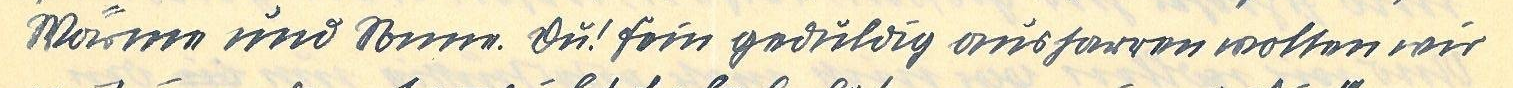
Wärme und Sonne. Du! Fein geduldig ausharren wollen wir
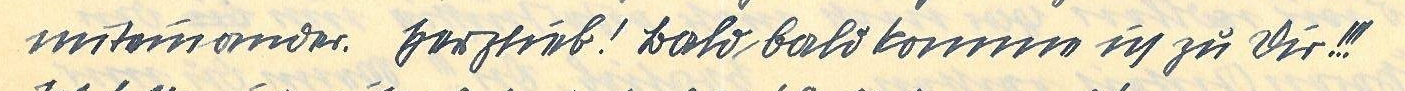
miteinander. Herzlieb! Bald, bald komme ich zu Dir!!!
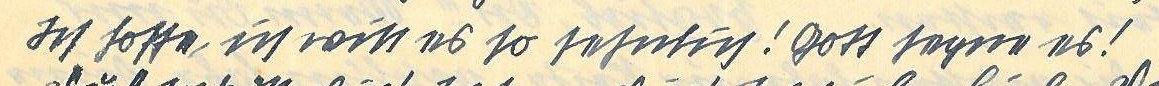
Ich hoffe, ich will es so sehnlich! Gott segne es!
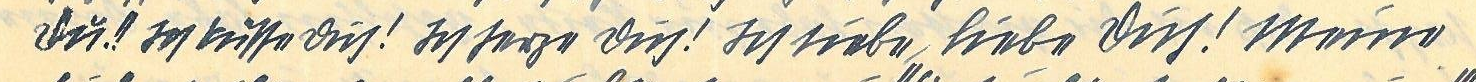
Du!! Ich küsse Dich! Ich herze Dich! Ich liebe, liebe Dich! Meine
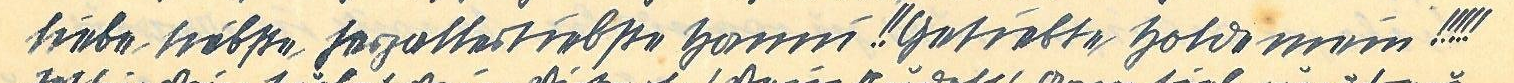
liebe, liebste, herzallerliebste!! Geliebte, Holde mein!!!!!!
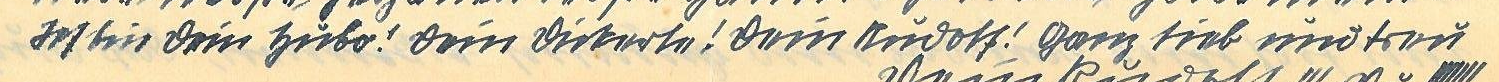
Ich bin Dein Hubo! Dein Dickerle! Dein! Ganz lieb und treu
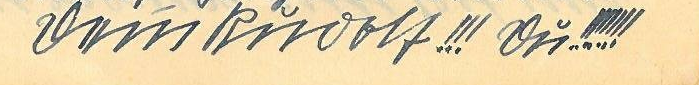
Dein!!! Du!!!!!!!
